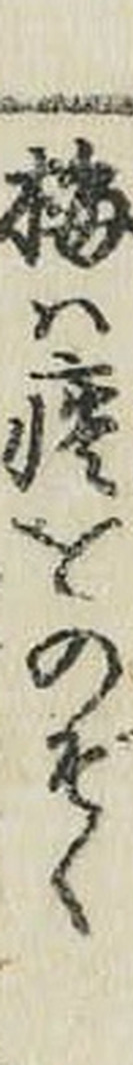梅は痰をのぞく
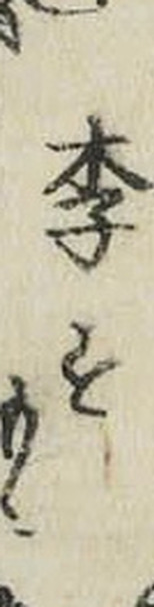李すもゝ
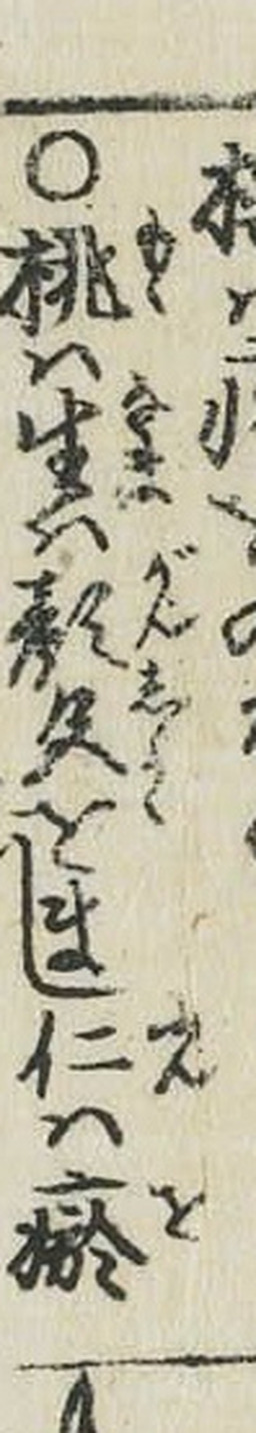○桃は生は顔色をまし仁は瘀
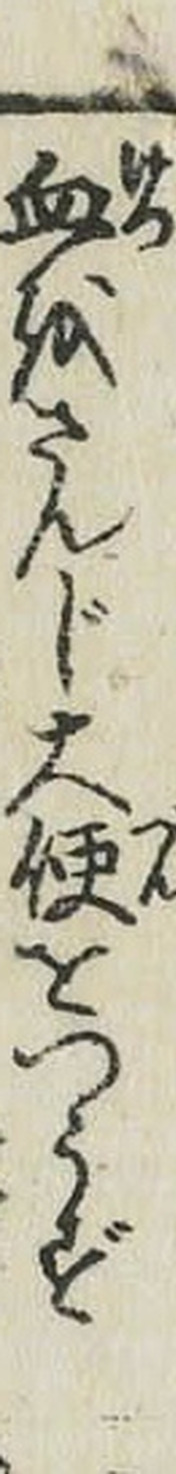血をさんじ大便をつうず
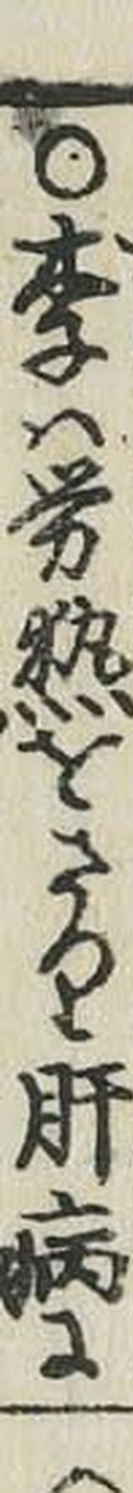○李は労熱をさり肝病に
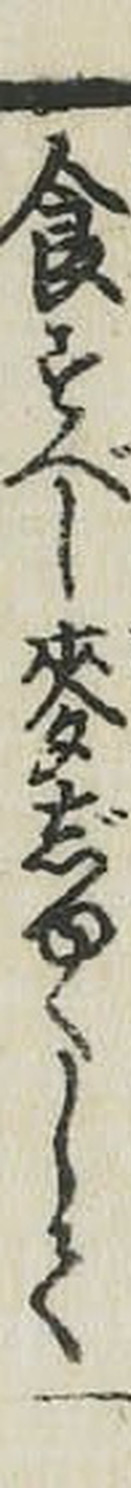食すべし麦じゆくして
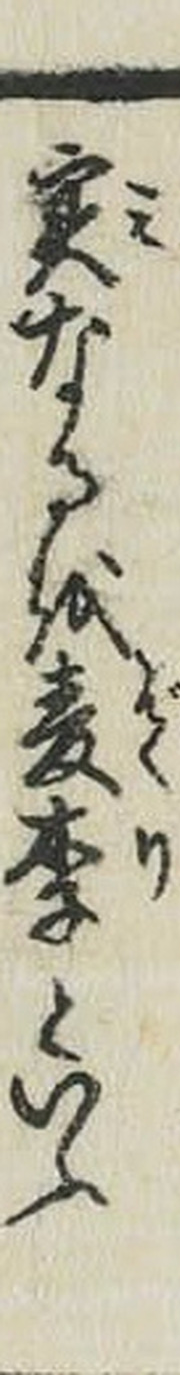実なるを麦李といふ

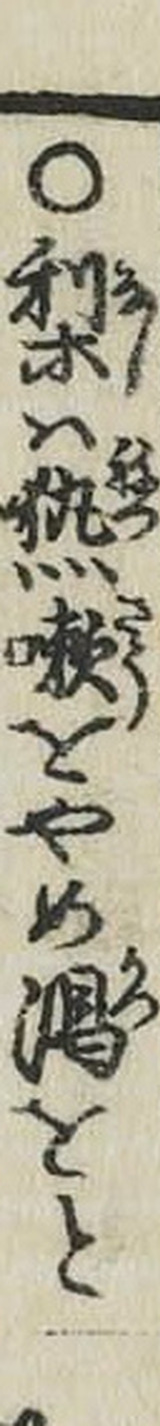○梨は熱嗽をやめ渇をと
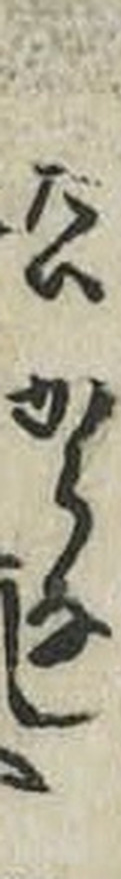柰からなし
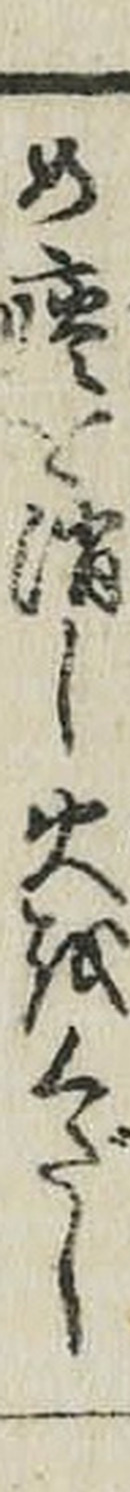め痰を消し火をくだし
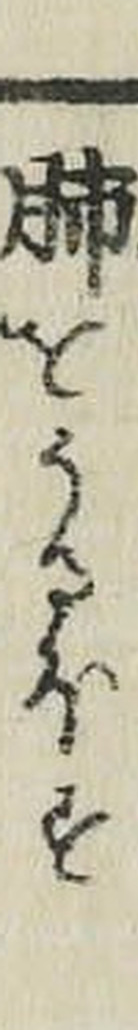肺をうるほす
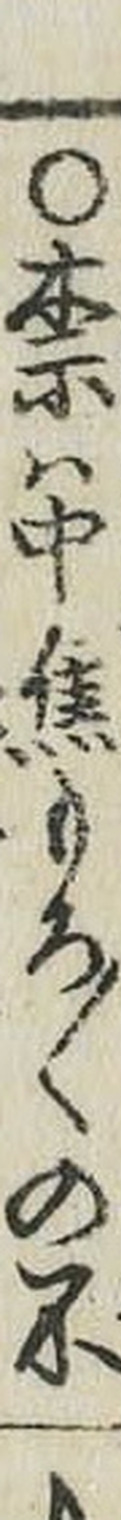○柰は中焦もろ〳〵の不
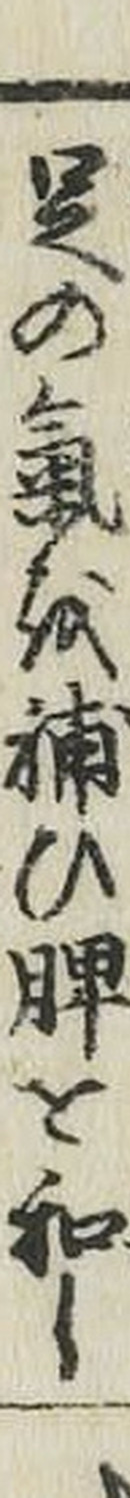足の気を補ひ脾を和し
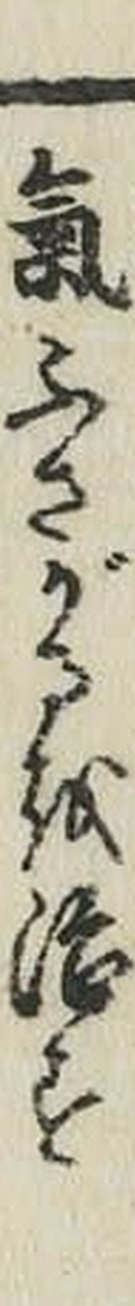気ふさがるを治す
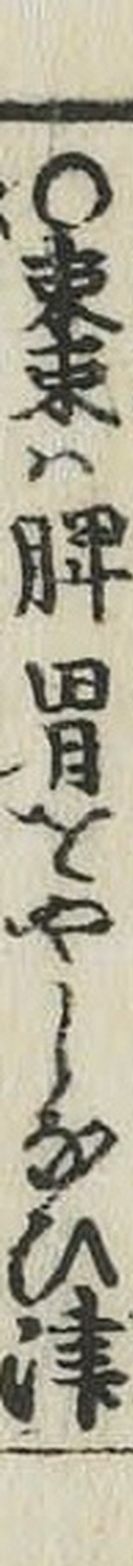○棗は脾胃をやしなひ津
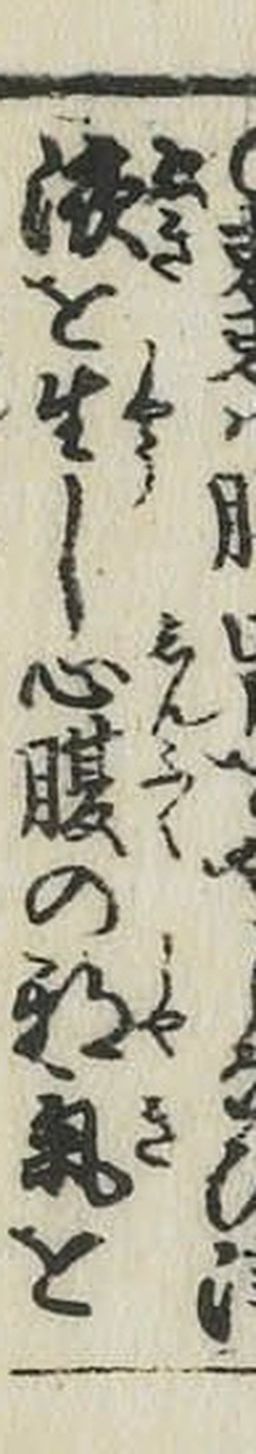液を生し心腹の邪気を
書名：増補頭書訓蒙図彙大成 10巻 8:巻之17-19
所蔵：東京学芸大学教育コンテンツアーカイブ
